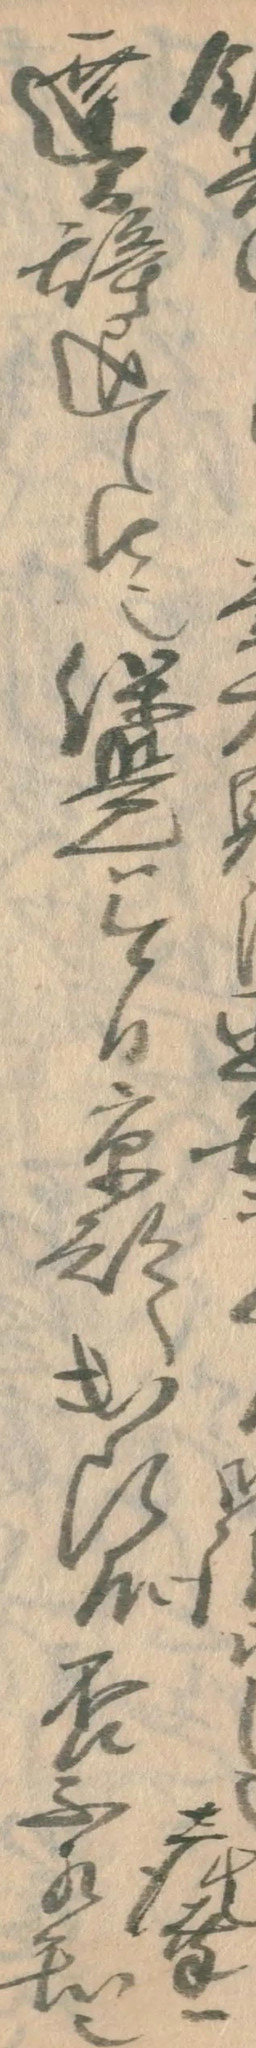達而辞退之由也保覚ハ今日京都へ出頭故否不相知也
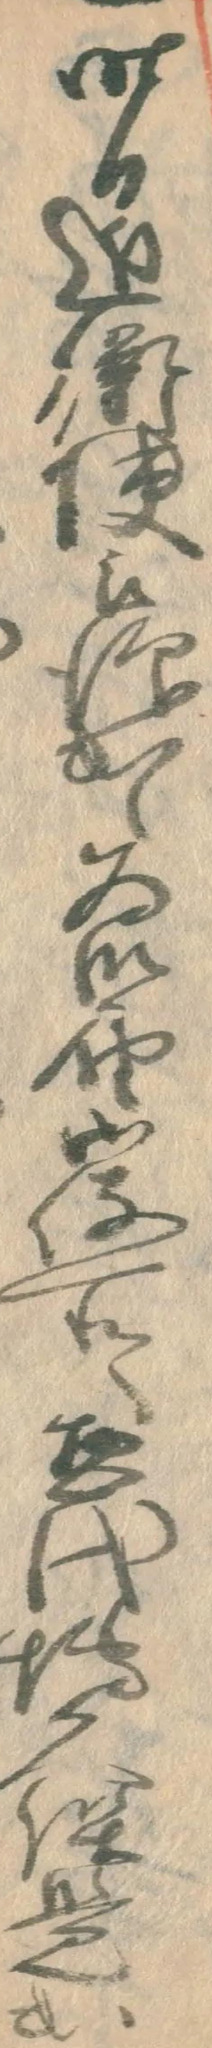一昨日近衛使被仰出候為御届御役所へ惣代博久保覚出

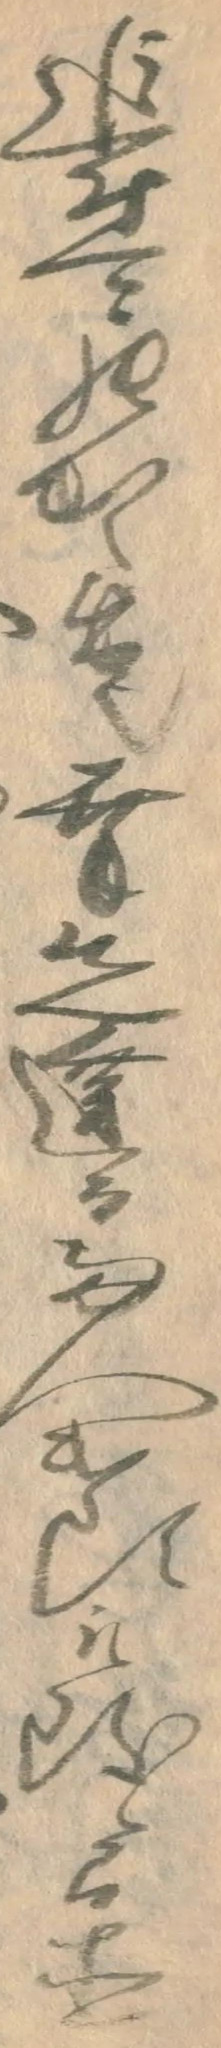追付可罷出候旨也幸先達而両人出頭被致候間直ニ
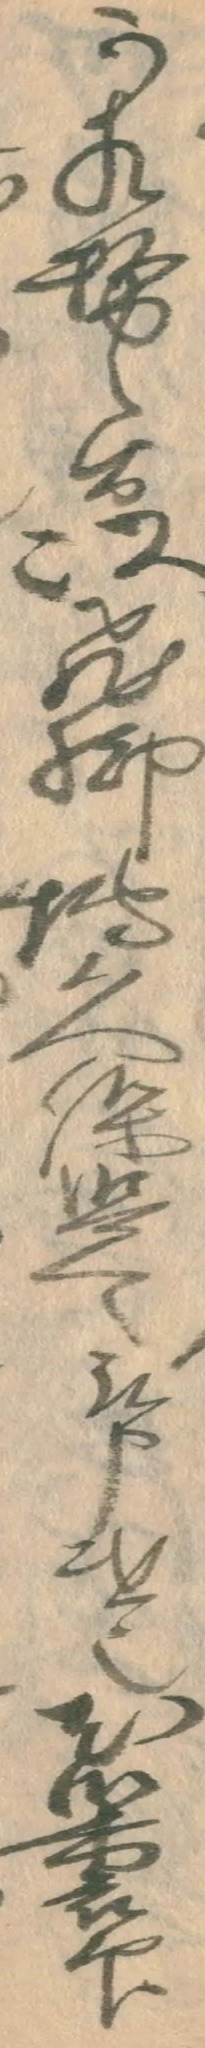可相務之旨以飛脚博久保覚へ被申遣也尤御裏印
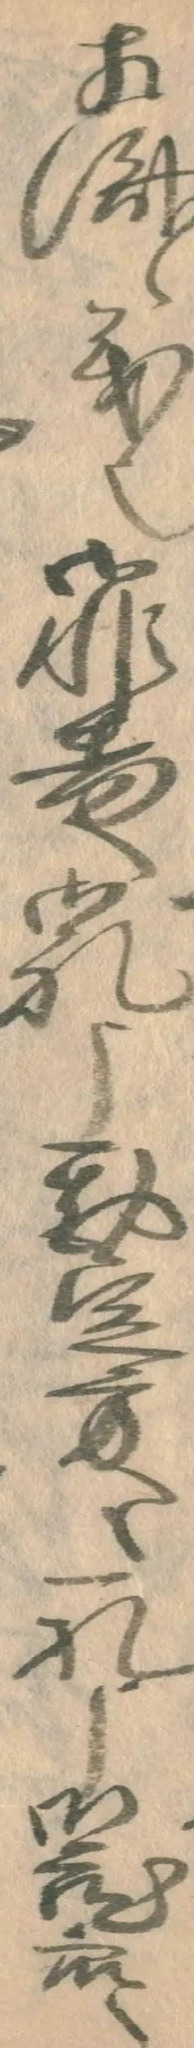相済候義也御非番へ御礼申勘定方へも一礼申御蔵衆へ
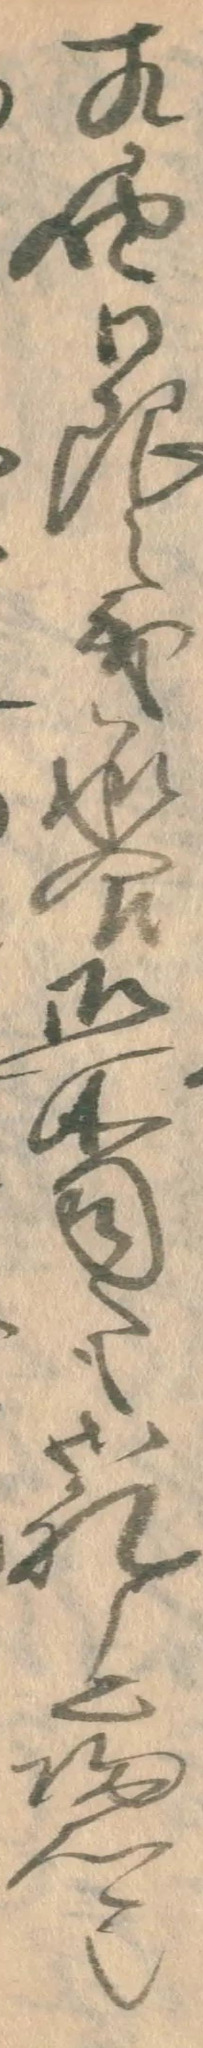相届日限之義承合御所司へも御礼申上帰郷也
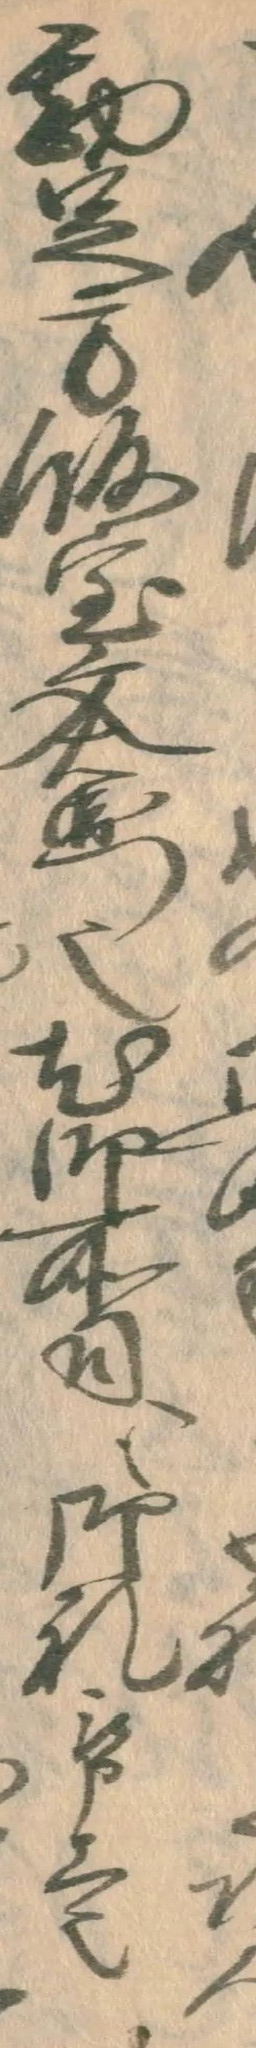勘定方飯室文右衛門也尤御所司へも御礼被申上也
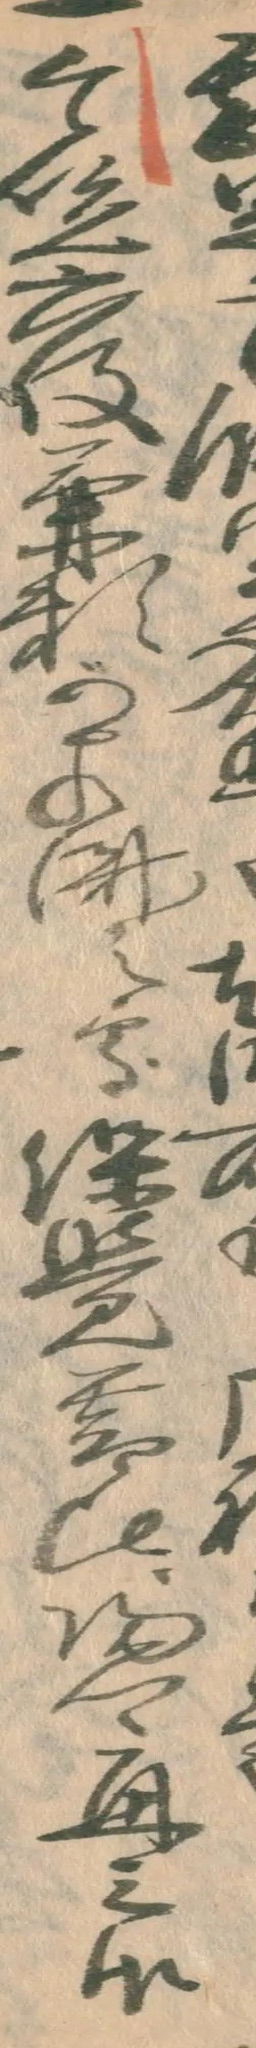一今晩六役兼頼可相済之処保覚暮比ニ帰郷再三御
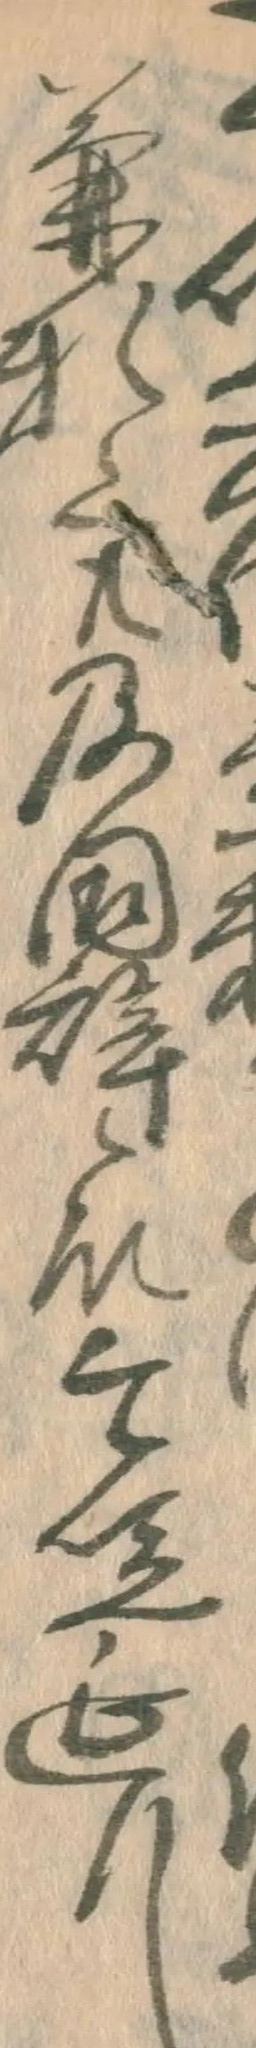兼頼候へ共及固辞候故今晩延引
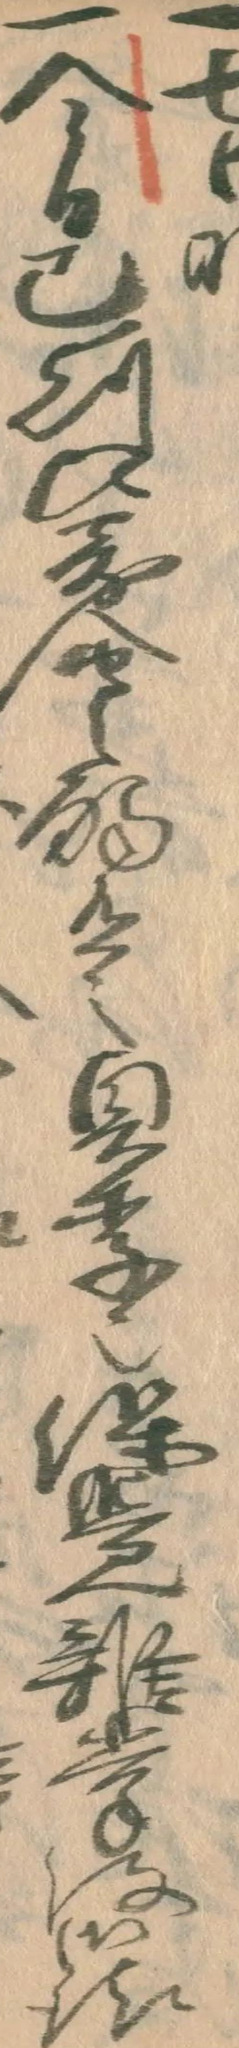一今日巳ノ刻比寄会之触有之貞季也保覚雑掌役御請
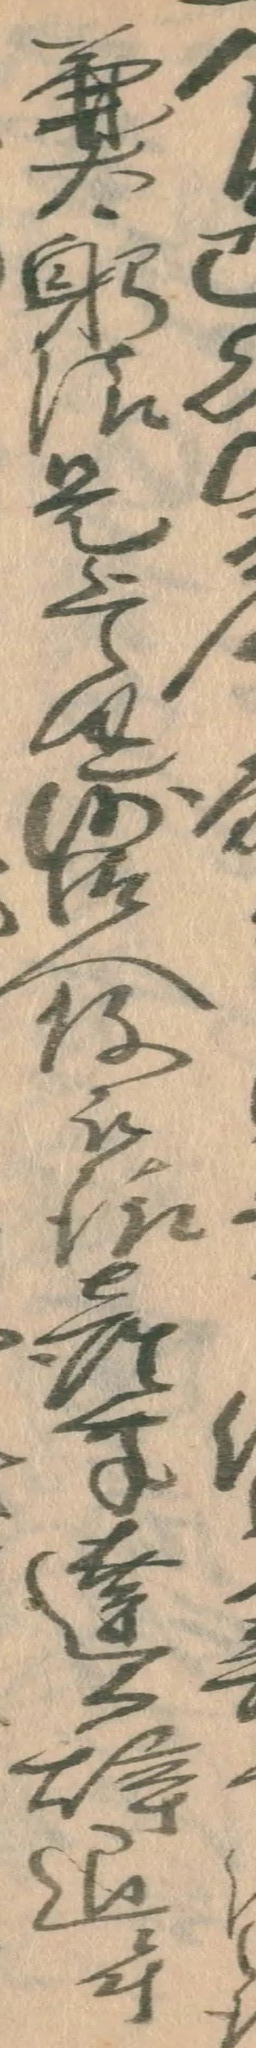兼太躬清是迄之通沙汰人役被請産幸達而辞退ニ付
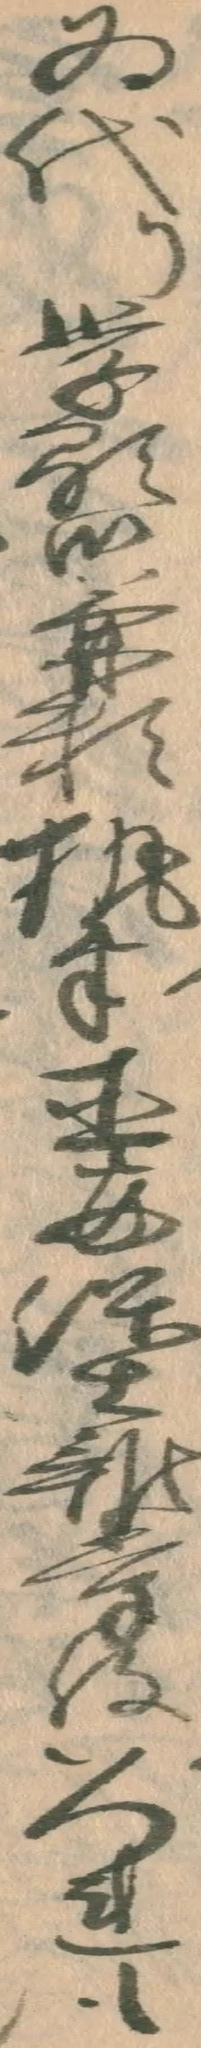為代り学顕御兼頼執筆直安保士雑掌役いつれも
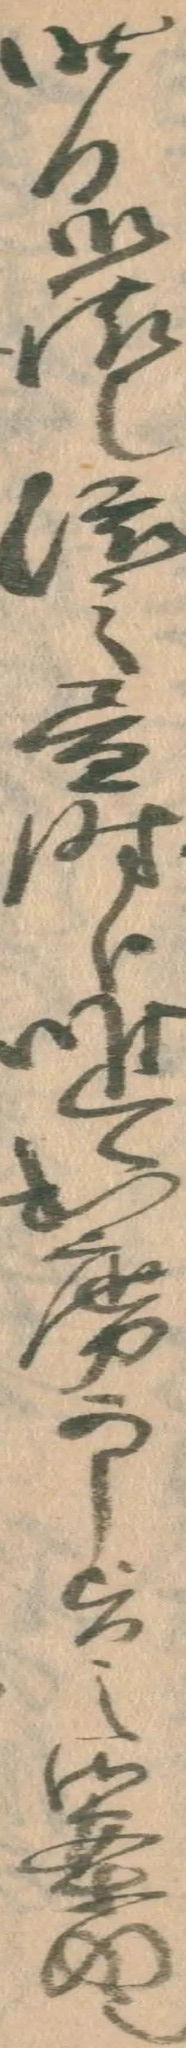昨日御請申候依之昼時分唯今出席可申旨之御案内也
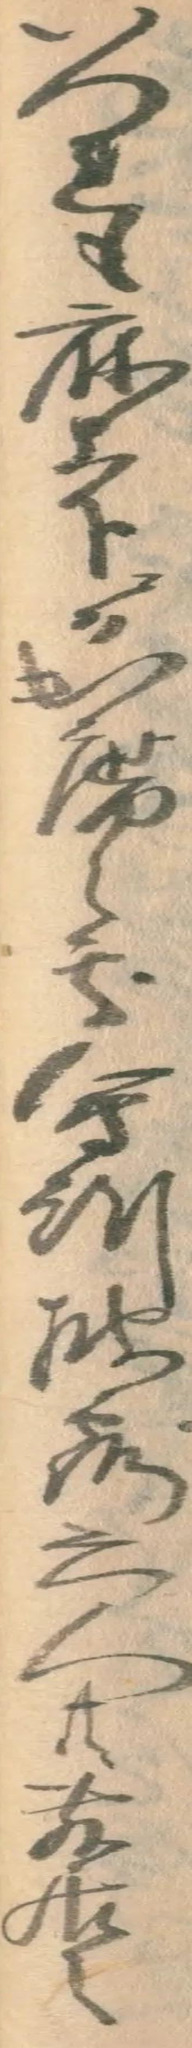いつれも麻上下ニ而出席之処会所披露六人共敷居之
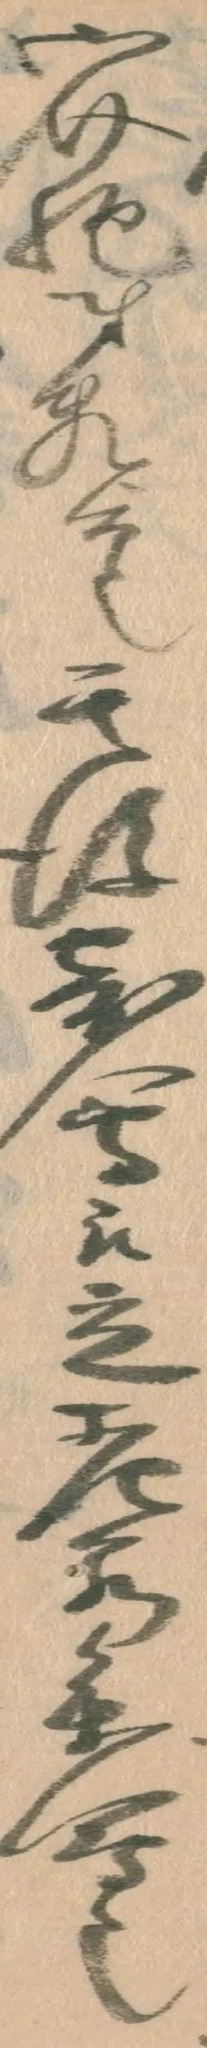御介抱奉頼旨申候其後寄会被立老若参会也
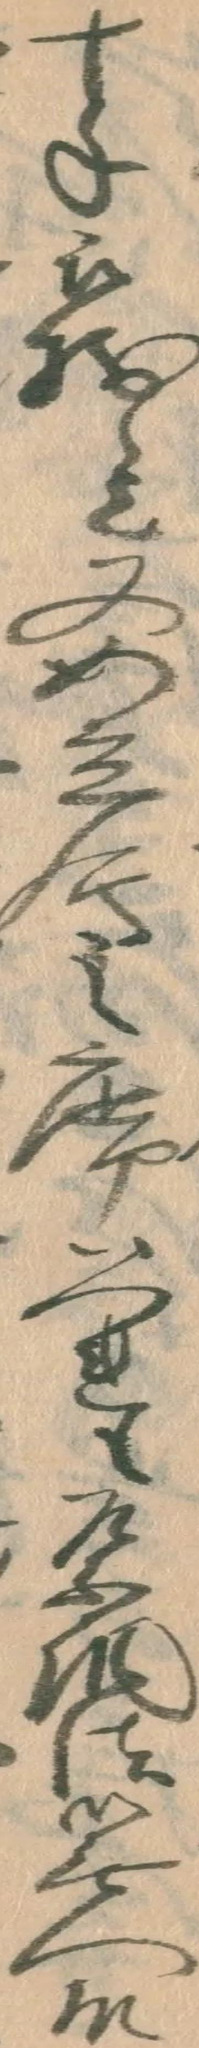十手被残候上又如立会之席いつれも乍不調法御無人故
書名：賀茂社記録. 第60冊
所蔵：国立国会図書館 National Diet Library, JAPAN
